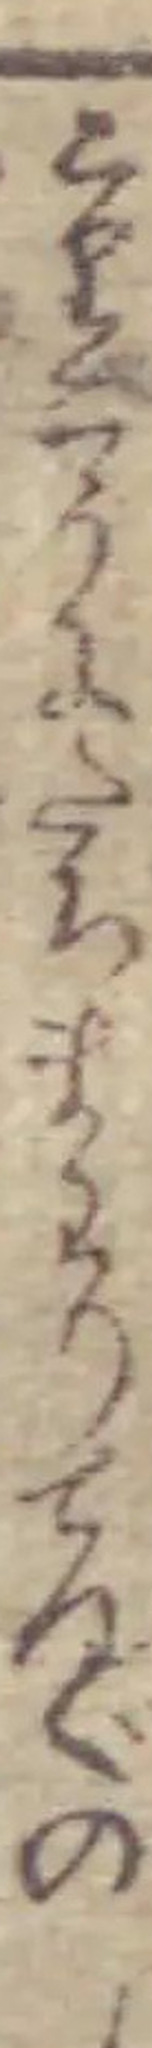こりこうにたちまわりてんぐの
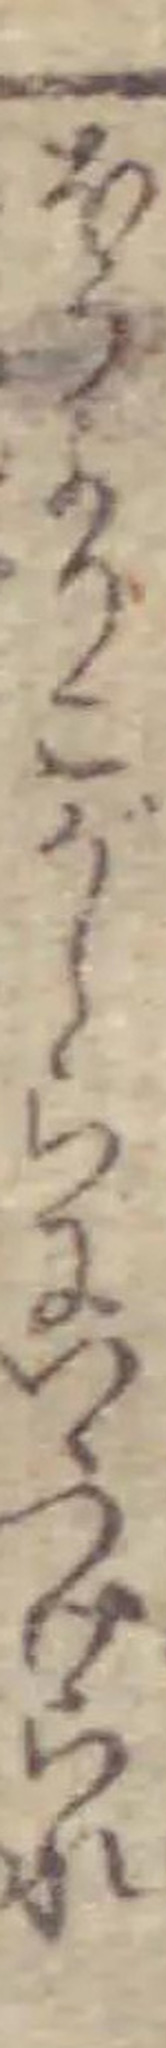ほうよりこがしらにいゝつけられ
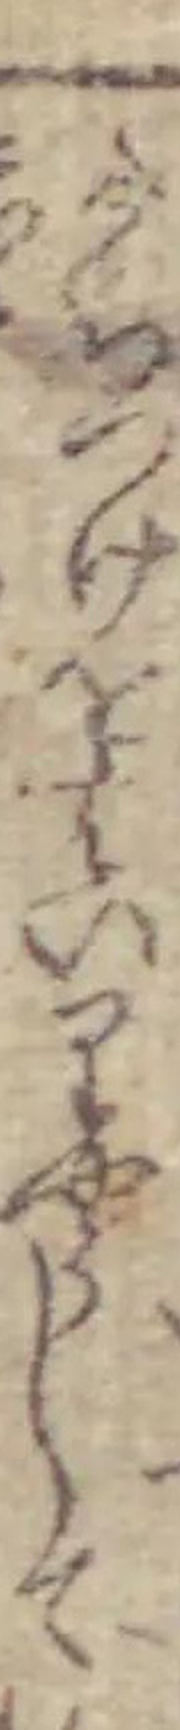たちつけをはいりやうして
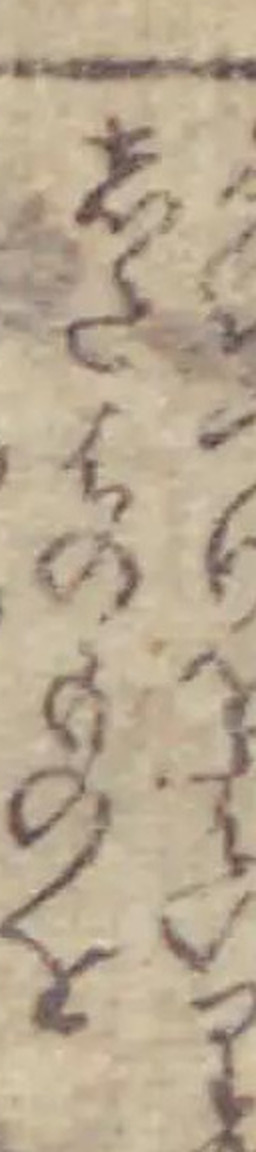したはのものを
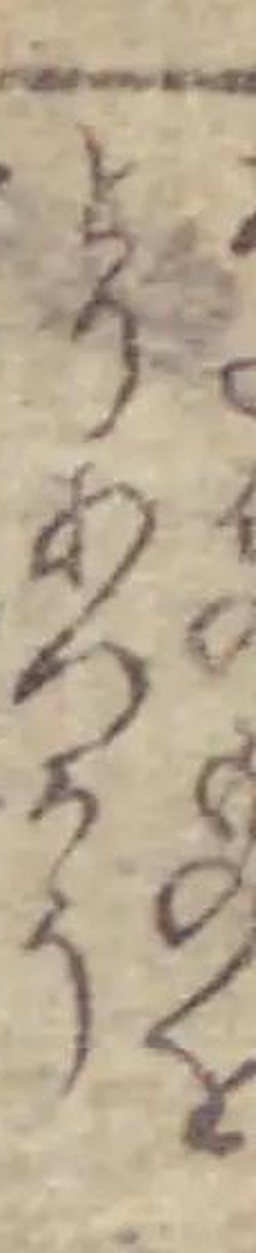とりあつかう
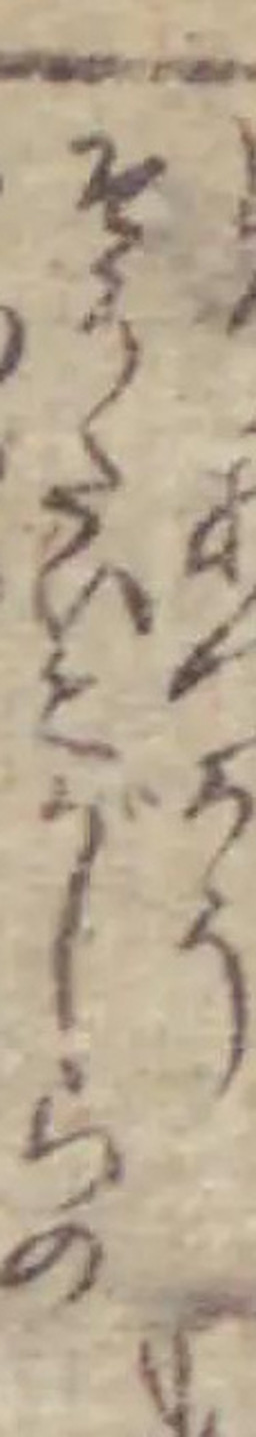そうたいこがしらの
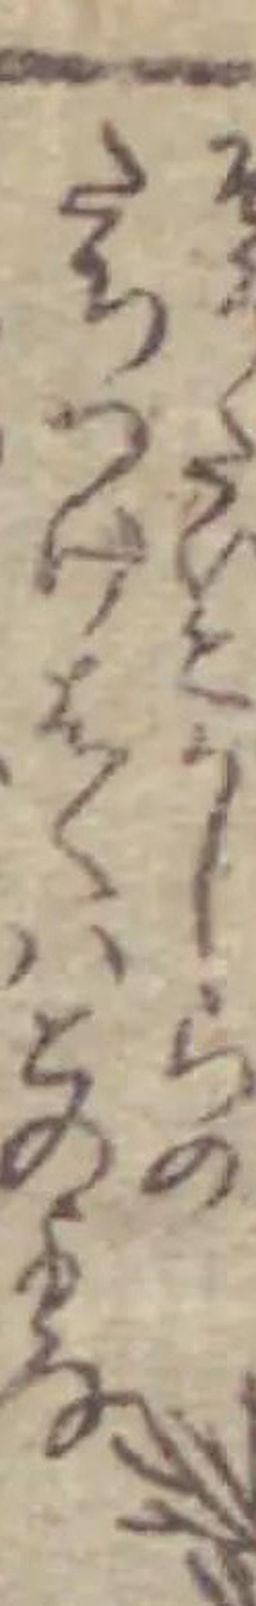たちつけはくはこのよな
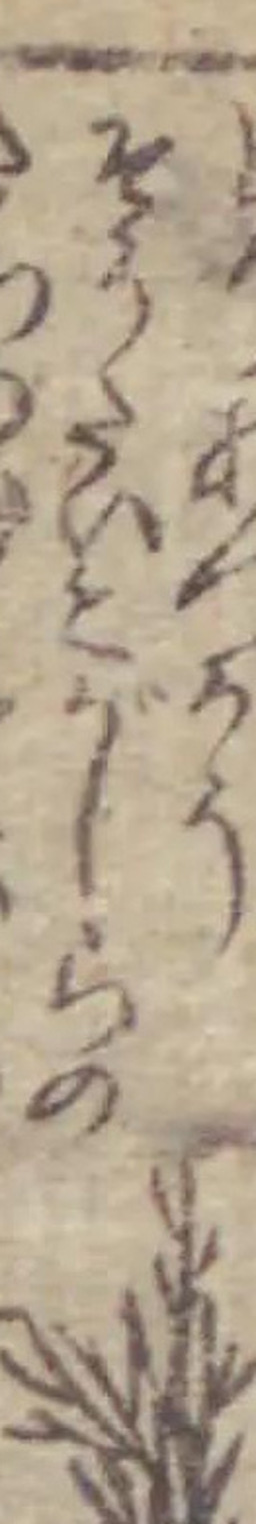そうたいこがしらの
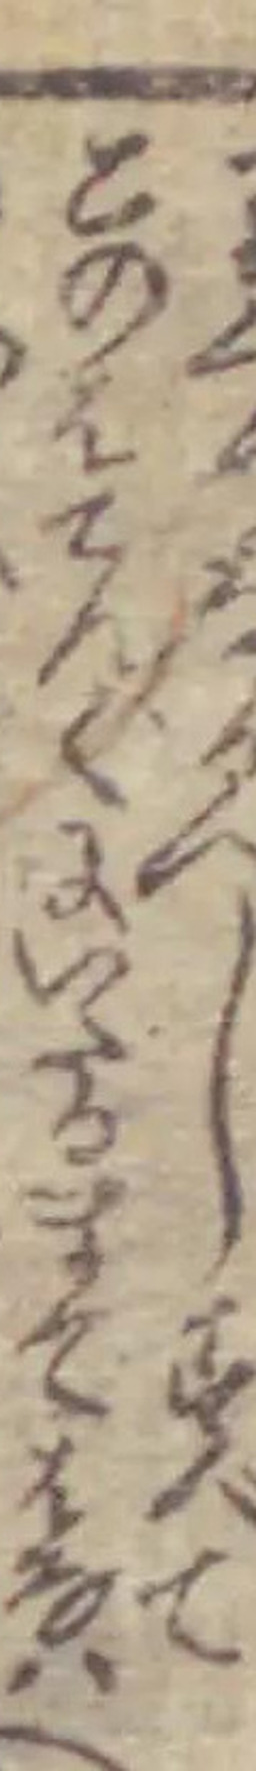このはてんぐにいたるまてはなは
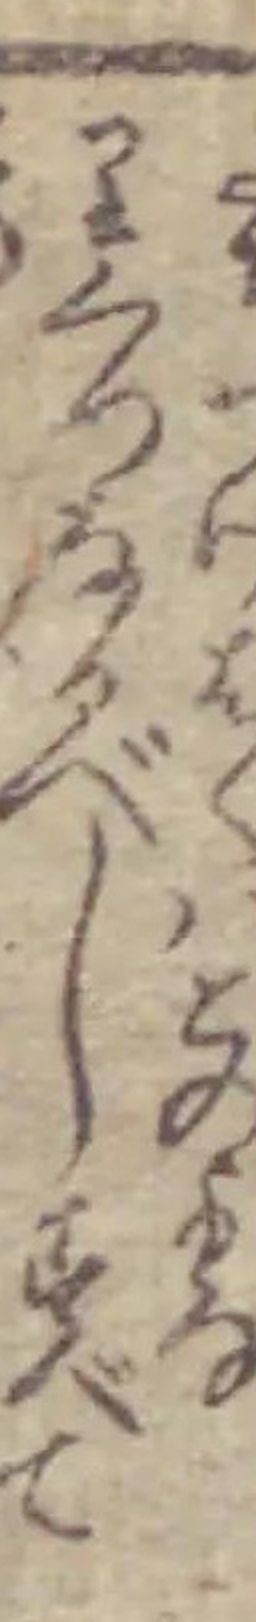りくつなるべしすべて
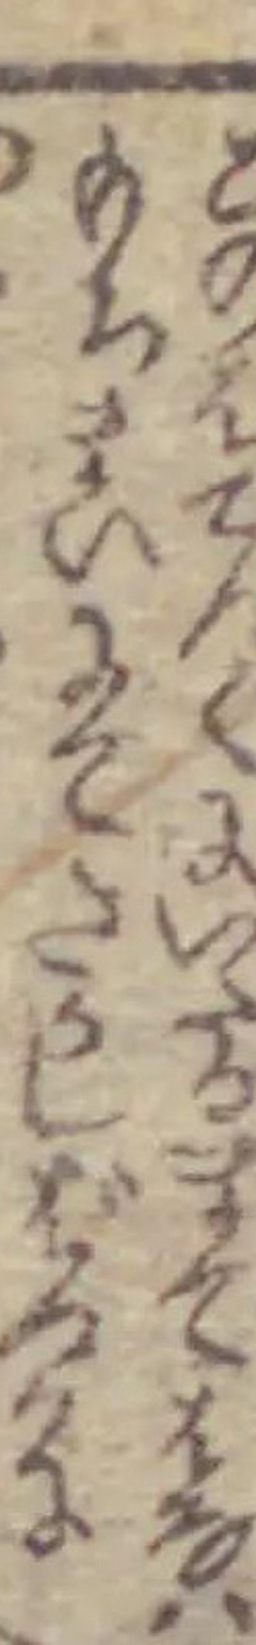もちまいにてたかしばつかに
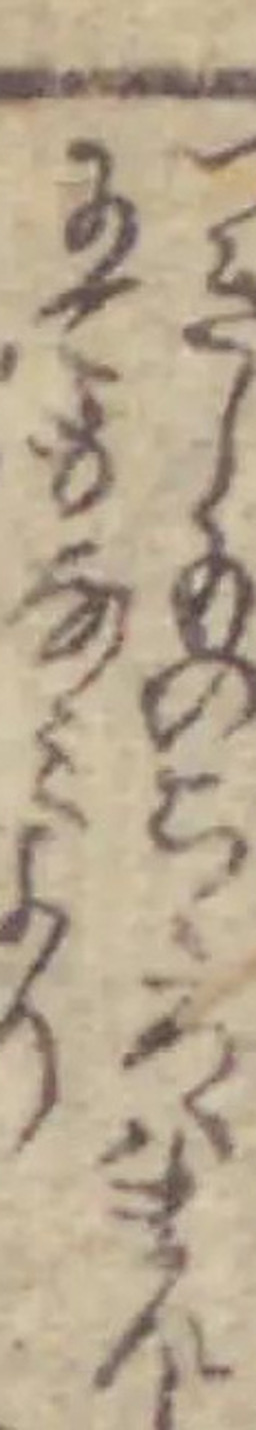にてもなみより
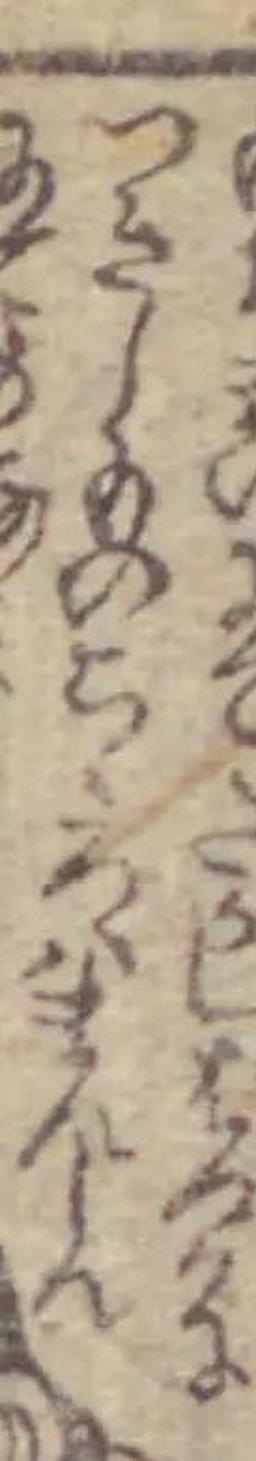つきしものこゝろはまんしん
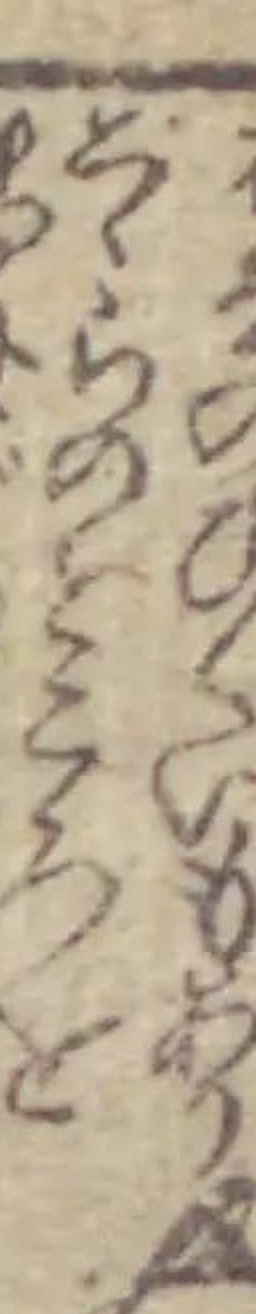こゝらのところを
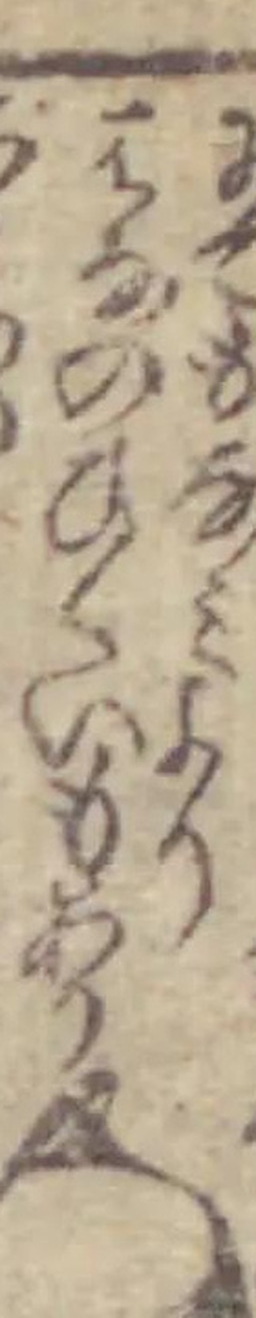はなのひくいもあり
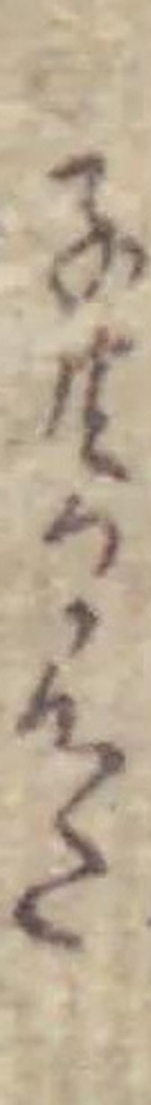子共が見た
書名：珍説女天狗 2巻
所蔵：国立国会図書館 National Diet Library, JAPAN
